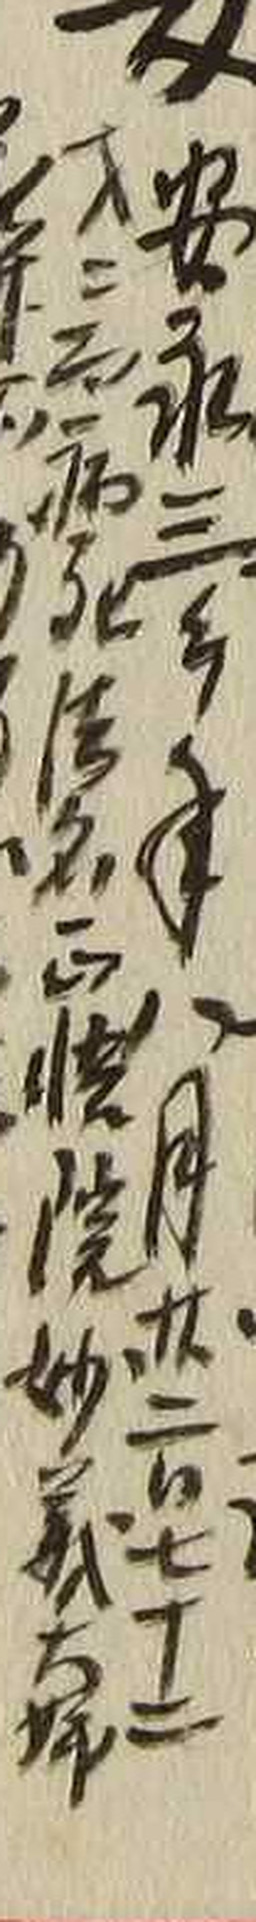才に而病死法名正悦院妙蔵大姉
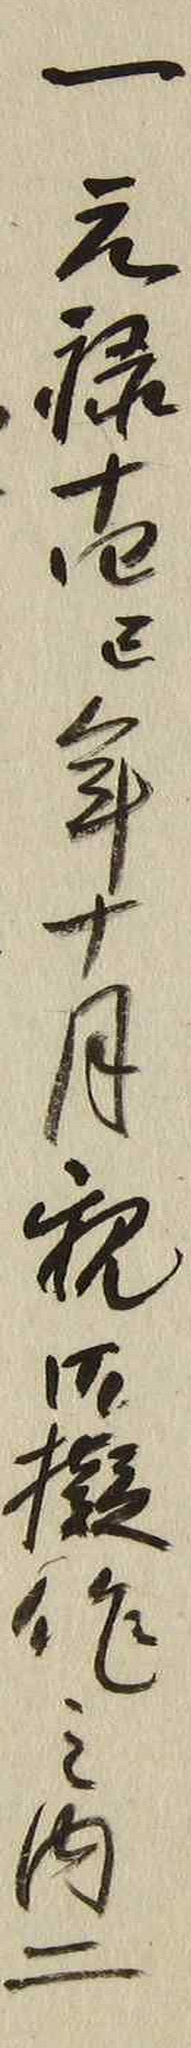一元禄十四巳年十月親御擬作之内二
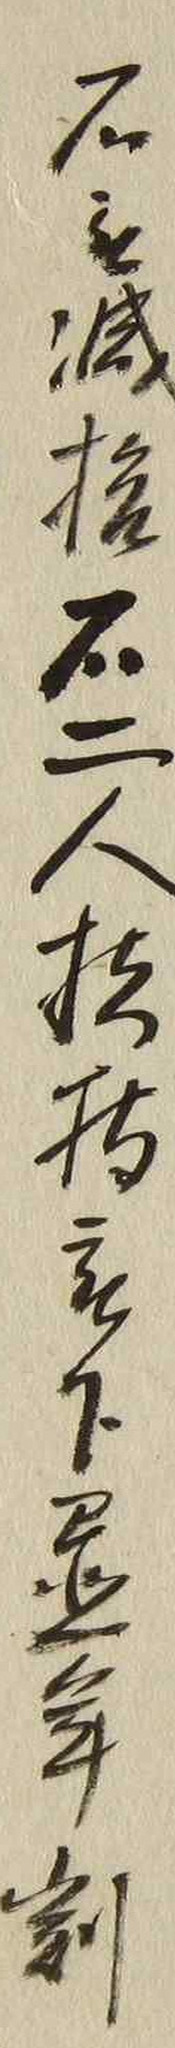石被減拾石二人扶持被下置年割
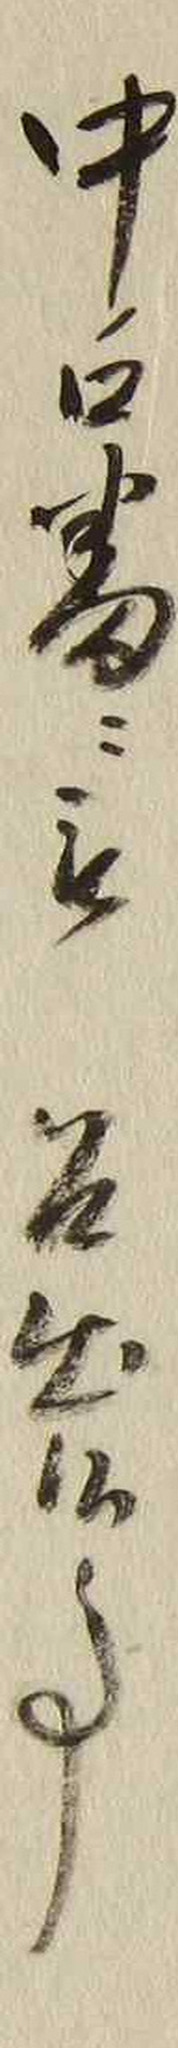中ノ口番に被召出候事
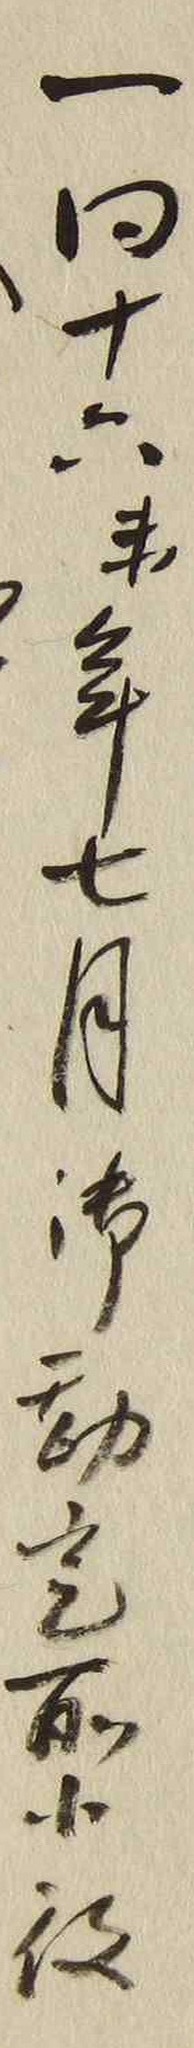一同十六未年七月御勘定所小役
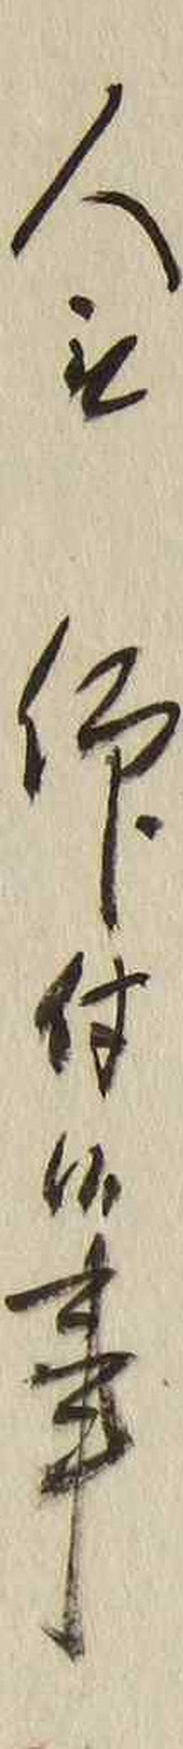人被仰付候事

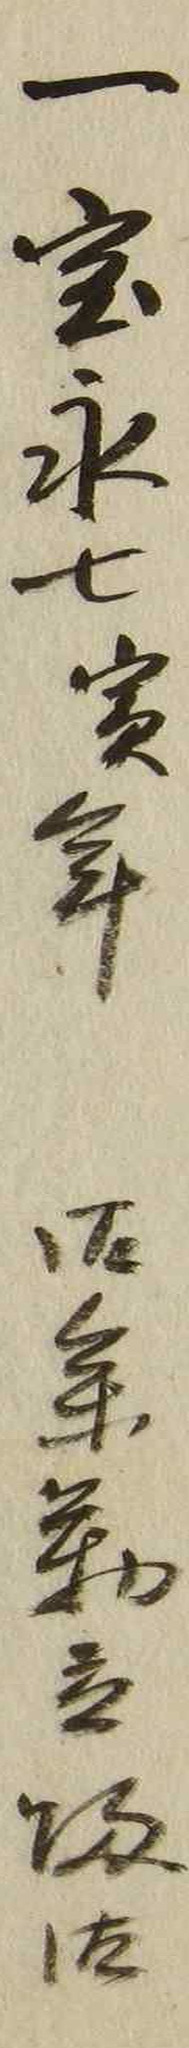一宝永七寅年御参勤立帰御
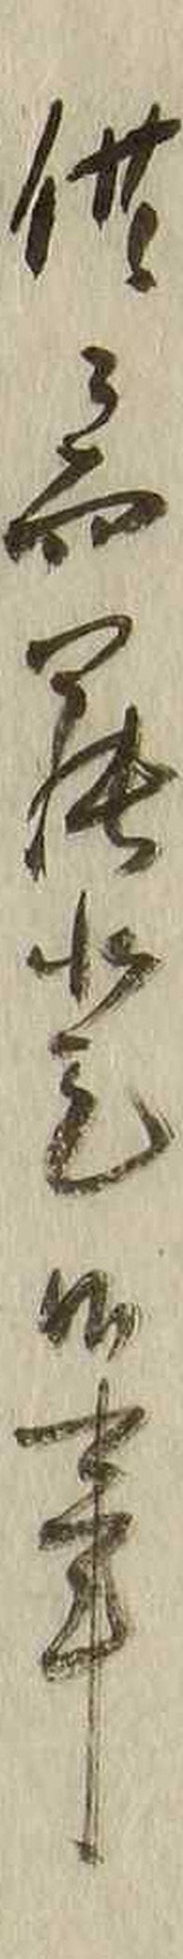供に而罷登候事
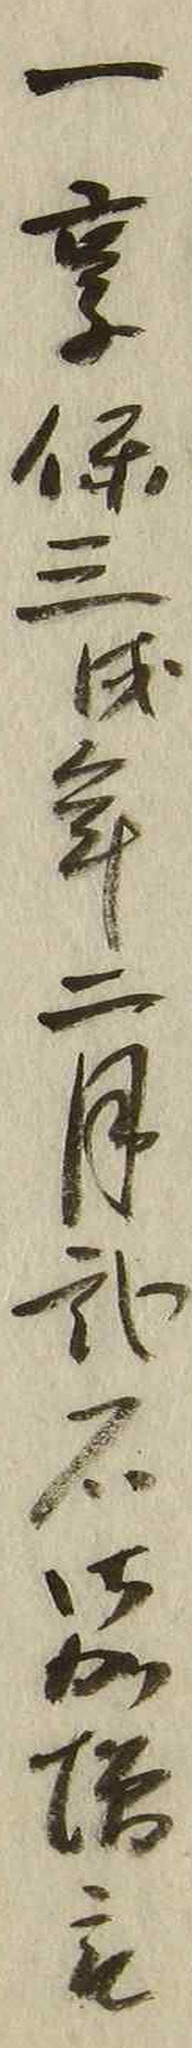一享保三戌年二月弐石御加増被
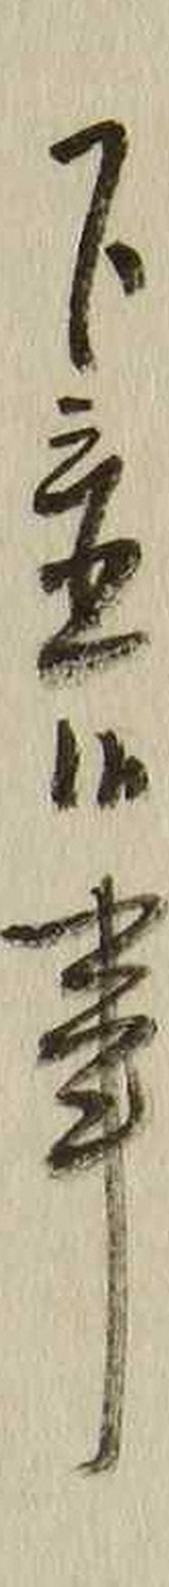下置候事
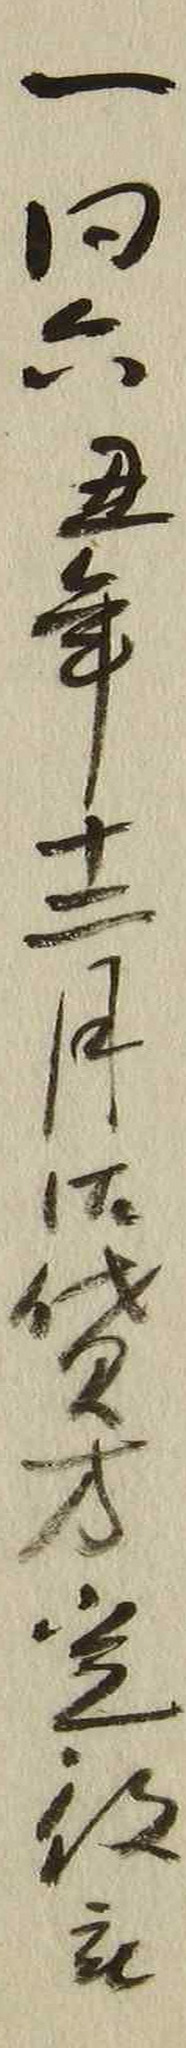一同六丑年十二月御貸方定役被
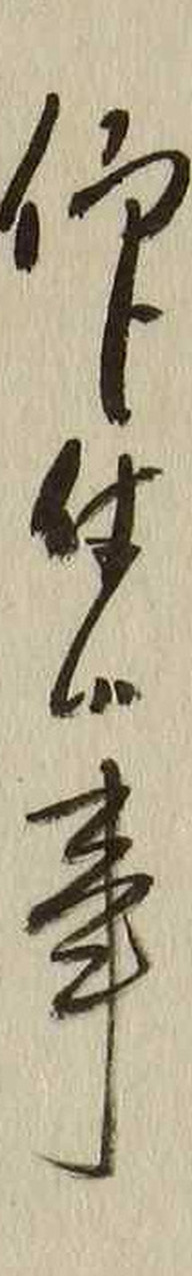仰付候事
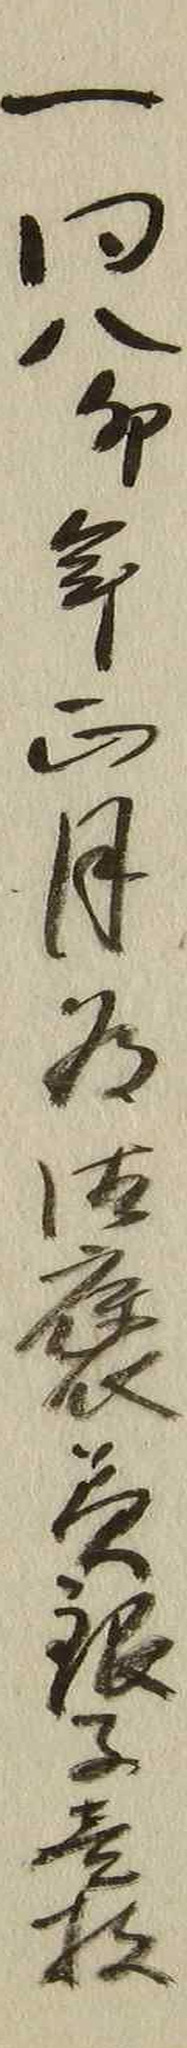一同八卯年正月為御褒美銀子壱枚
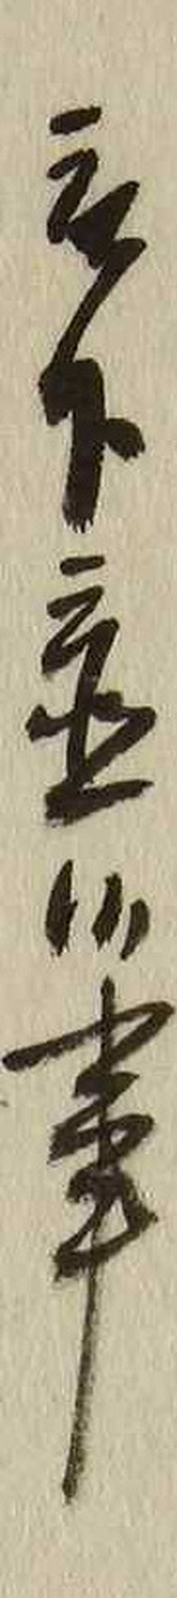被下置候事
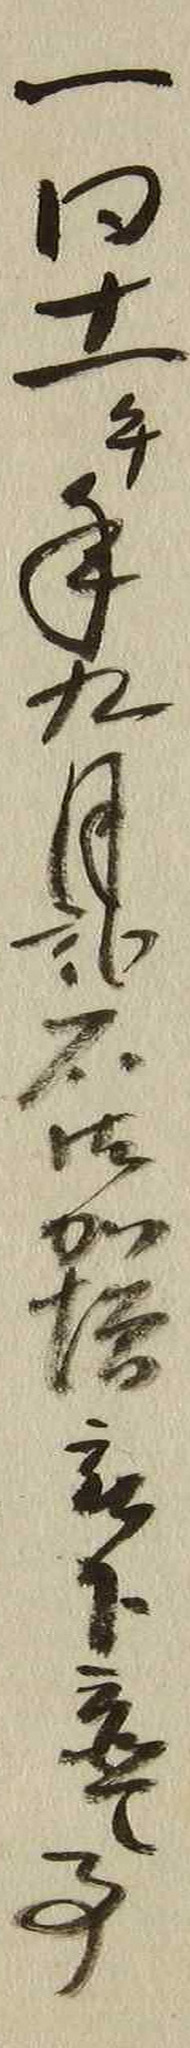一同十一午年九月弐石御加増被下置候事
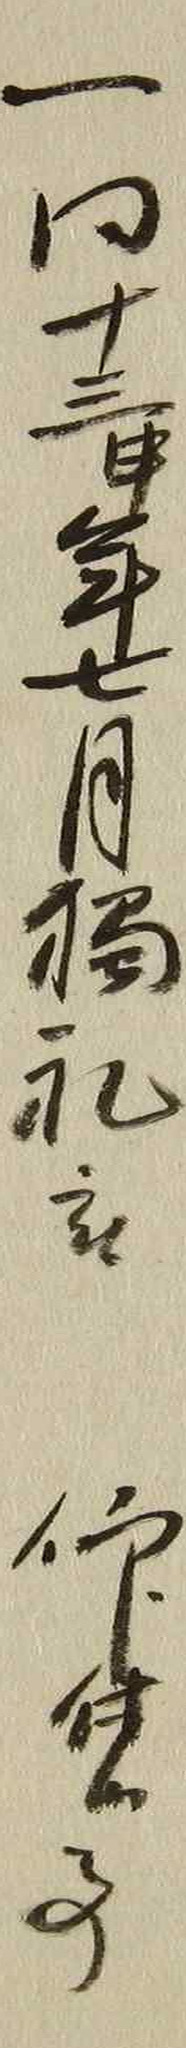一同十三申年七月独礼被仰付候事
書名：諸士系譜　巻之360　す之部10
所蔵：会津若松市立会津図書館
